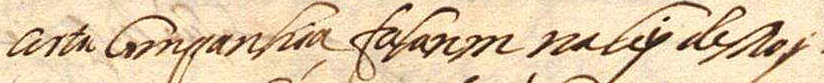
certa Companhia, falarem na Ley de Moy
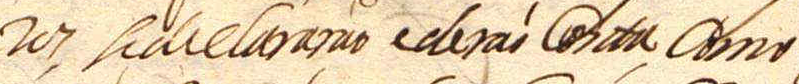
zes, se declararaõ e deraõ Conta Como,
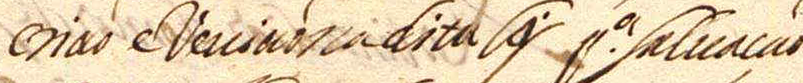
criaõ e Veuiaõ na dita Ley p.a saluaçaõ
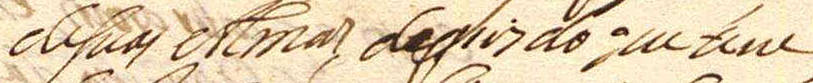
de suas Almas, depois do que teue
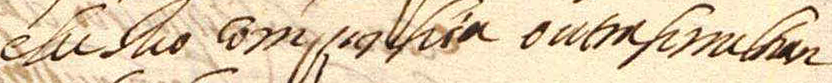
elle Reo companhia outra semelhan
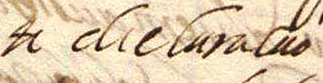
te declaraçaõ
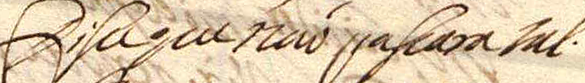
Disse que naõ passara tal.
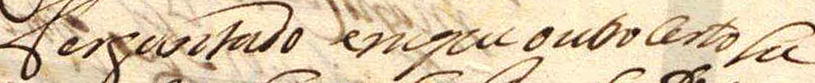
Perguntado em que outro certo lu
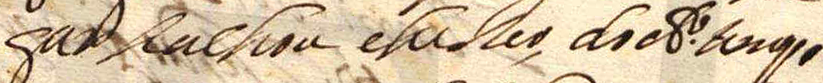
gar se achou elle Reo, do d̄.o tempo
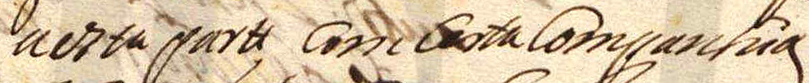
nesta parte, com certa Companhia
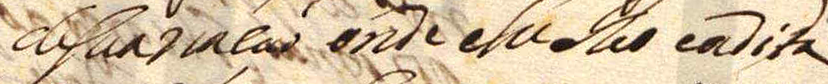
de sua naçaõ onde elle Reo e a dita
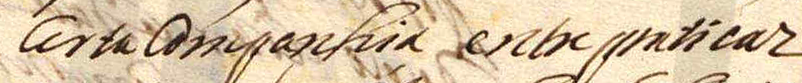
certa companhia, entre praticaz
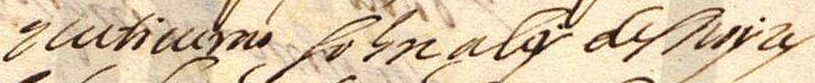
que tiueraõ sobre a ley de Moyzes
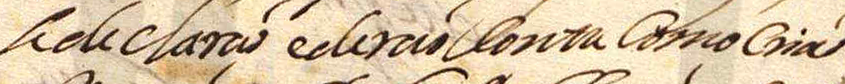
se declaraõ e deraõ Conta Como Criaõ
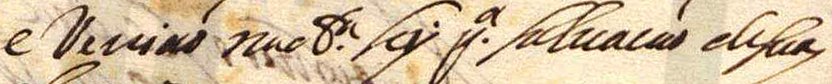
e Veuiaõ na d̄a Ley p.a saluacaõ de suas
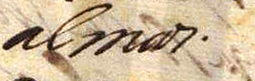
almas.
